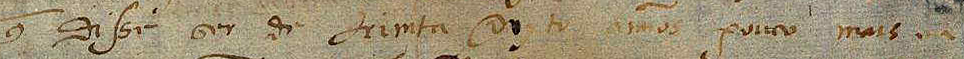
q̅ disse ser de trimta e oyto an̅nos pouco mais ou
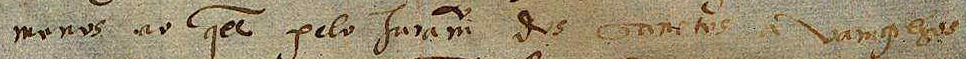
menos ao q̅ll pelo Juramto dos sanctos avangelhos
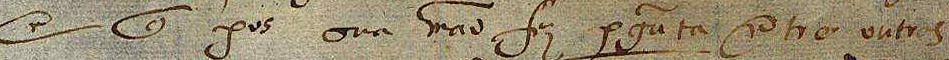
ē q̅ pos sua mão fez ꝑg̅uta e̅tre outras
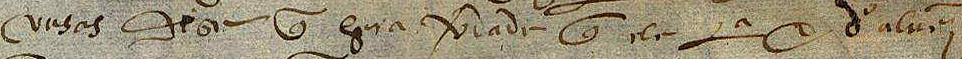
Cousas dise q̅ hera ꝟdade q̅ ele ta e do alue̅z
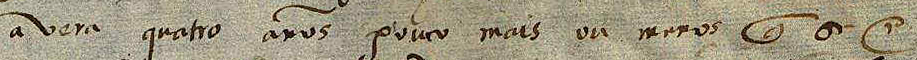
avera quatro an̅os pouco mais ou menos q̅ se e̅
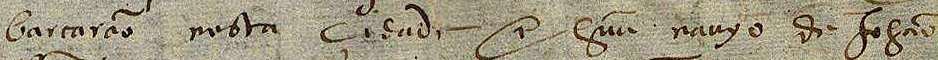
barcara̅o nesta Çidade e̅ hu̅u nauyo de Johaõ
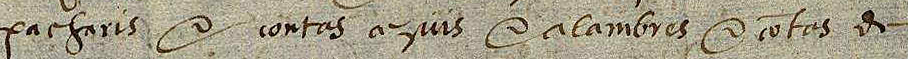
pacharis e contas azuis e alambres e c̅otas de
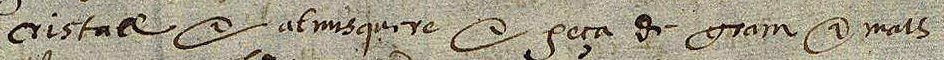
cristall e almisquere e peça de gram q̅ mais
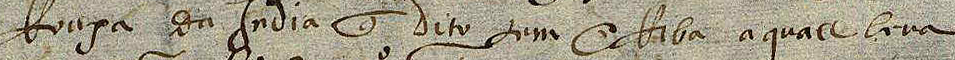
Roupa da Jndia q̅ dito tem e̅ Riba a quall leua
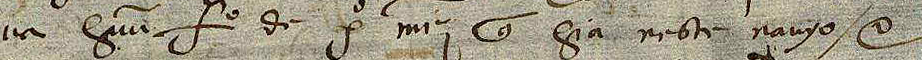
ua hu̅u fo de po m̅iz q̅ hia neste nauyo / e
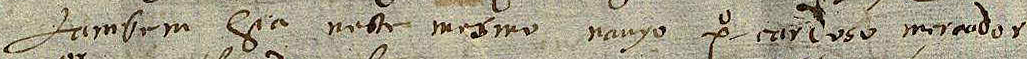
tambem hia neste mesmo nauyo po cardoso mercador
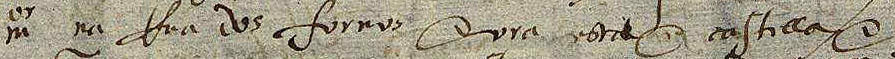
mor na Rua dos fornos e ora esta e̅ castella / e
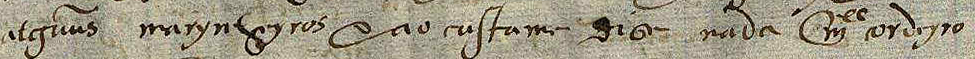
algu̅us marynheyros e ao custume dise nada mell cordeyro
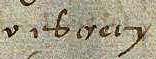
o escreuy
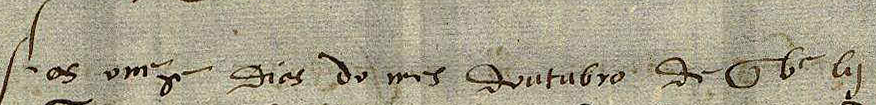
Aos omze dias do mes doutubro de j̄ bc lij
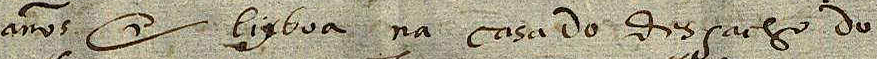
an̅os e̅ lixboa na casa do despacho do
